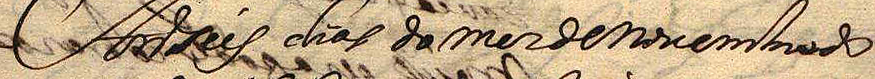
Aos seis dias do mez de nouembro do
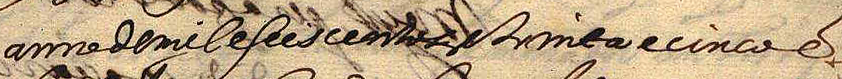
anno de mil e seiscentos e trinta e cinco ē
